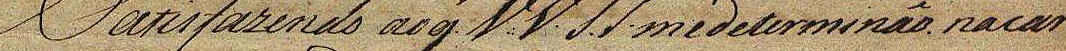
Satisfazendo ao q̄ V.V. S.S.as me determinaraõ na car
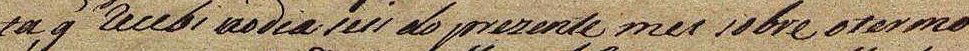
ta, q̄ Recebi ao dia seis do prezente mes sobre o termo
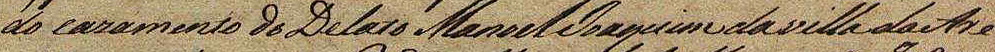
do cazamento do Delato Manoel Ioaquim da villa da Aré
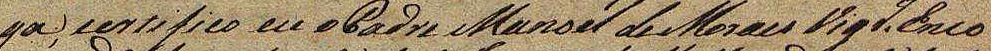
ga, certifico eu o Padre Manoel de Moraes Vig.o Enco
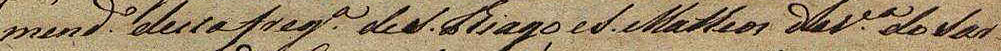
mend.o desta freg.a de S. Thiago e S. Matheos da V.a do Sar
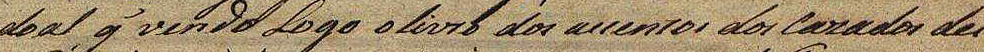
doal q̄ vendo Logo o livro dos assentos dos cazados des
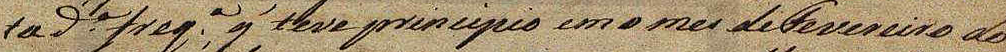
ta d.a freg.a q̄ teve principio em o mes de Fevereiro do
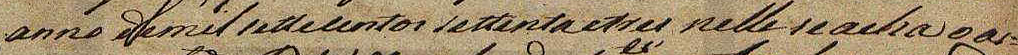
anno d̄ mil settecentos settenta e tres nelle se acha o as
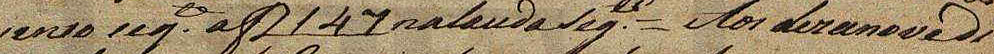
sento seg.te a fl 147 na lauda seg.te = Aos dezanove di
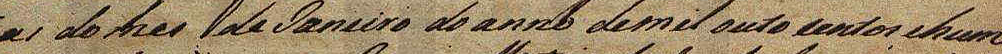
as do mes de Ianeiro do anno de mil outocentos e hum
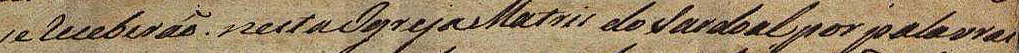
se Receberaõ. nesta Igreja Matriz do Sardoal, por palavras
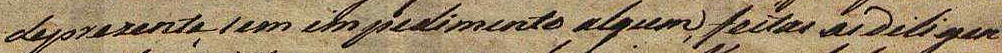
de presente, sem impedimento algum, feitas as diligen
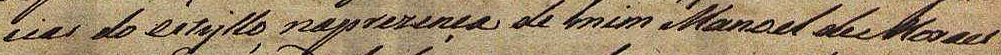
cias do estyllo, na prezença de mim Manoel de Moraes
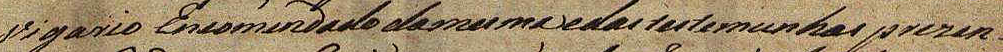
vigario Encomendado da mesma, e das testemunhas prezen
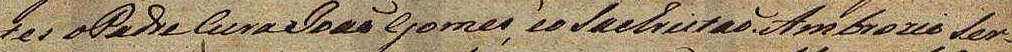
tes o Padre Cura Ioaõ gomes e o Sachristaõ Ambrozio Ser
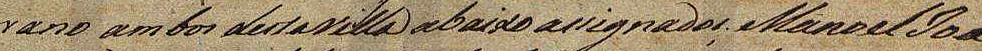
rano ambos desta villa abaixo assignados; e Manoel Ioa
